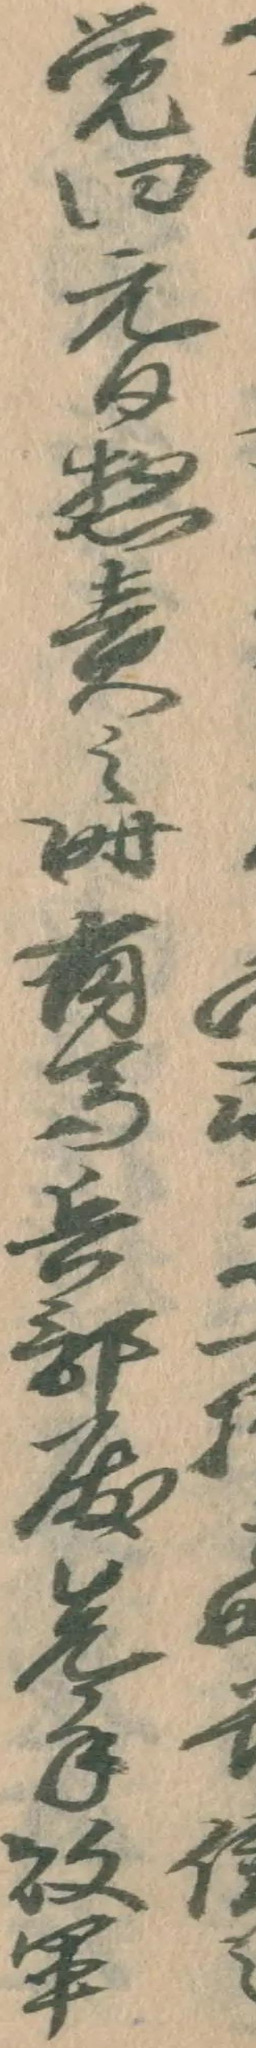覚曰元日惣責之時有馬兵部殿先手敗軍
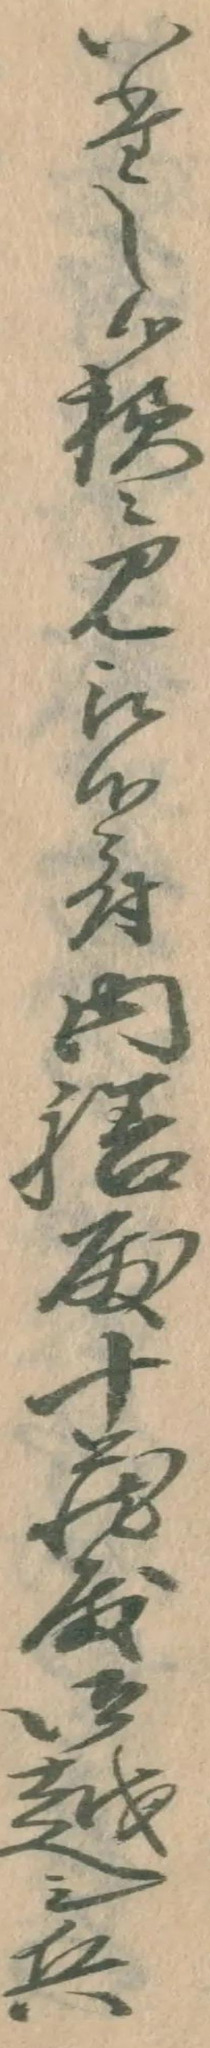い堂し候様に見江候に付内膳殿十蔵御越し兵
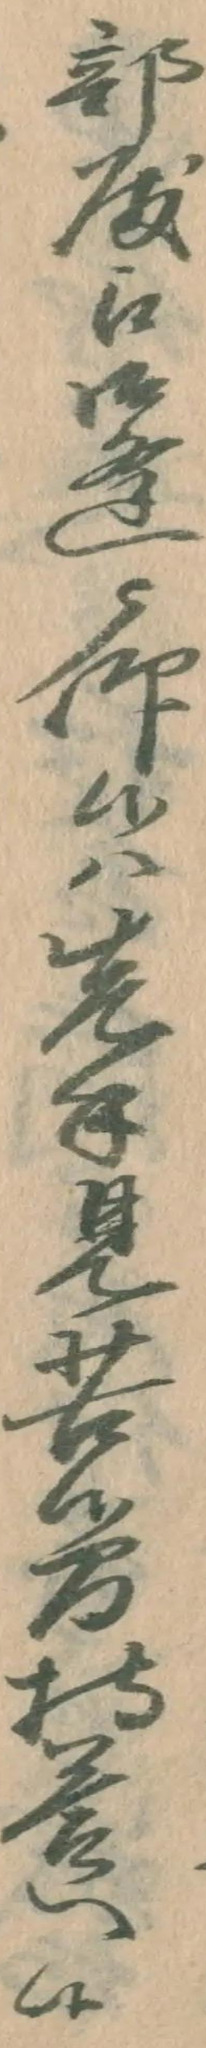部殿江御逢被仰候は先手見苦候間持答へ候
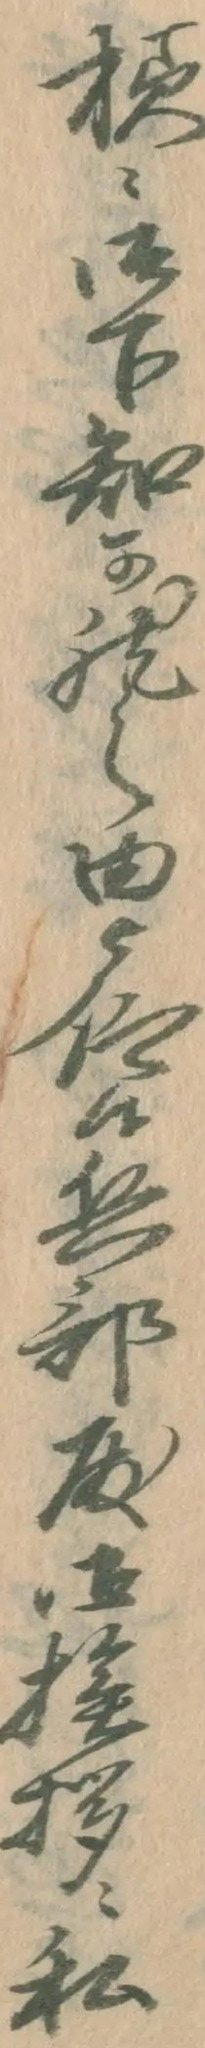様に御下知可然之由被仰候兵部殿御挨拶に私

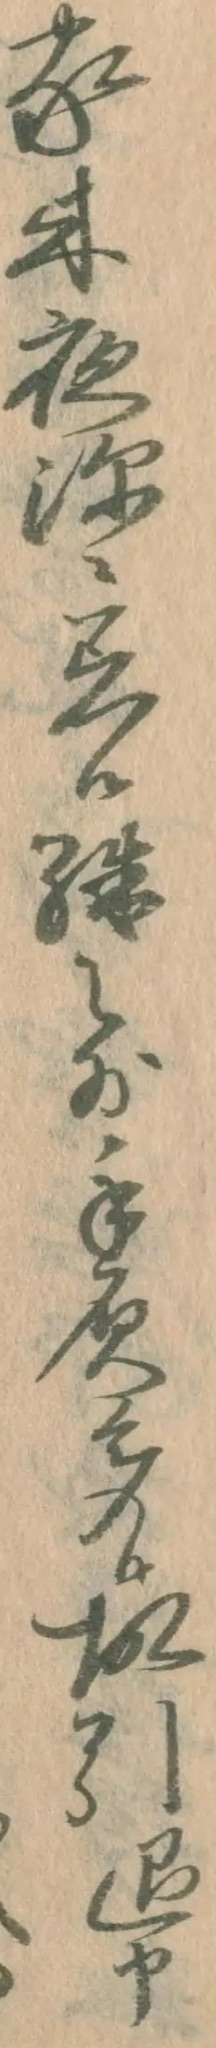家来夜深に着候殊之外手負多候故引退申
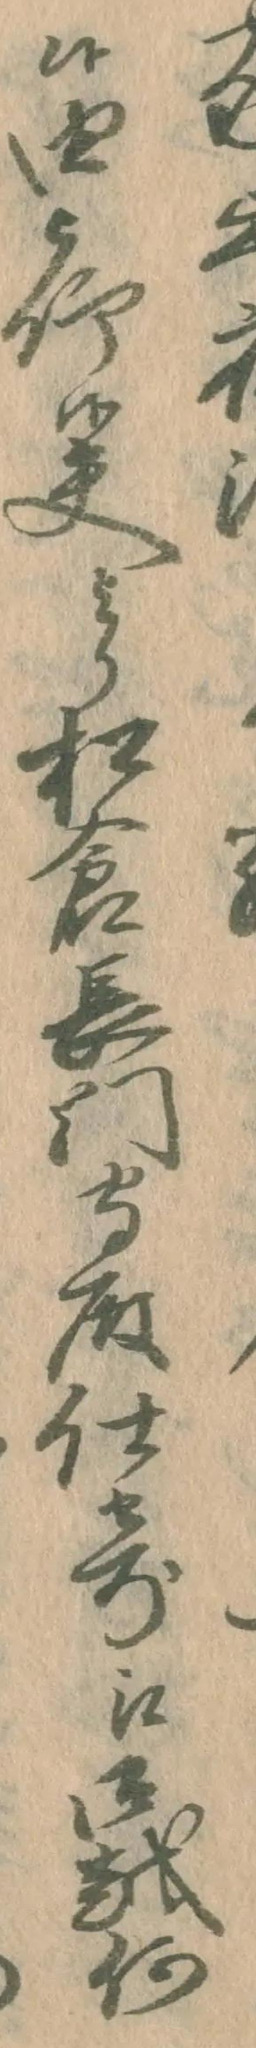候由被仰候夫与り松倉長門守殿仕寄江御越何
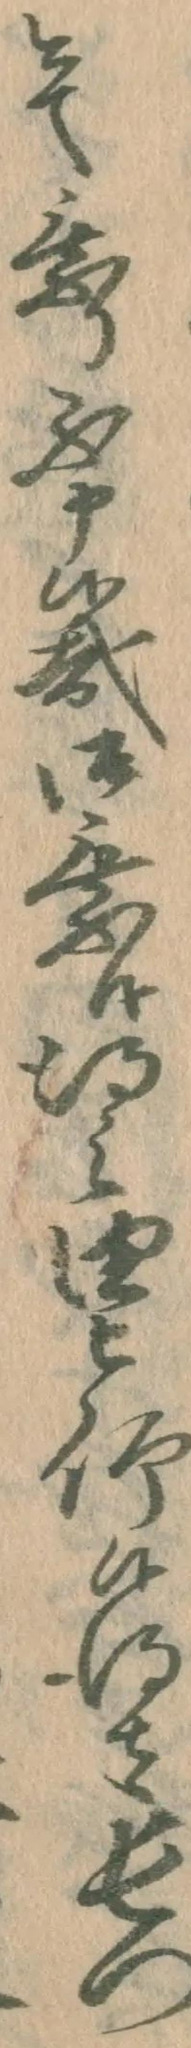とて乗りふ申候哉御乗候得之由被仰候得者長門
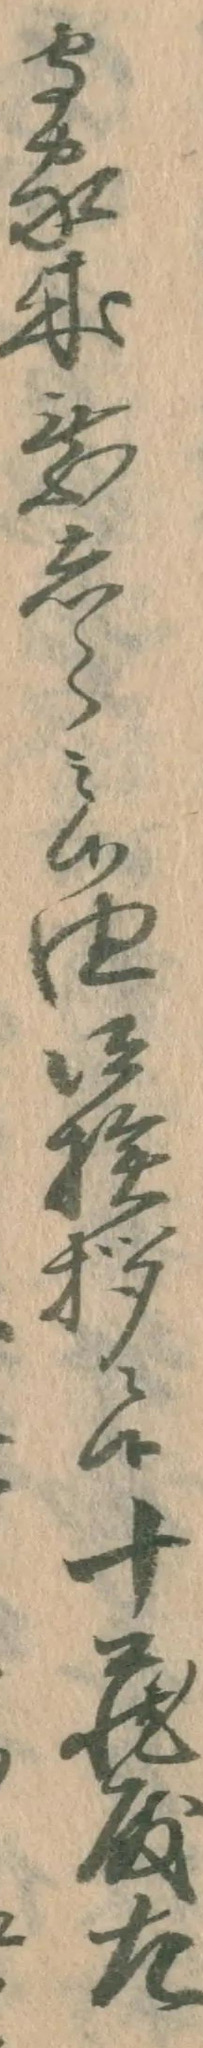守家来乗者ら之候由御挨拶に候十蔵殿左
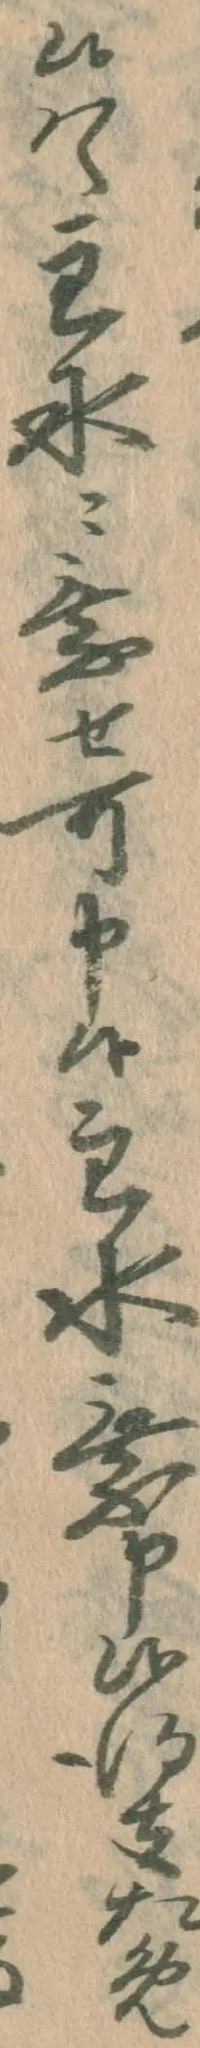候はゝ主水に乗せ可申候主水乗申候得者た免
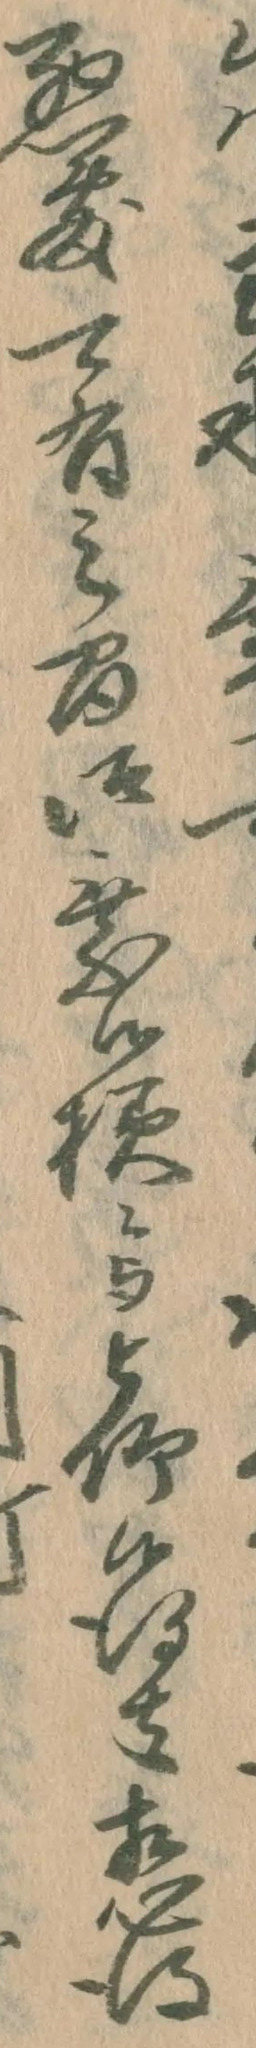悪敷可有之間御乗候様に与被仰候得者相心得
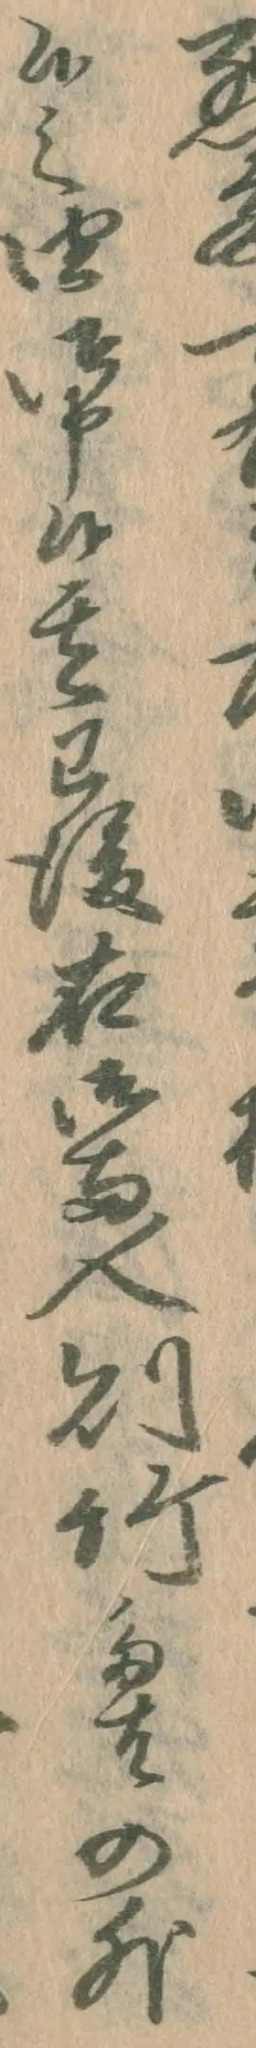候之由御申候其已後右御両人則竹多者の外
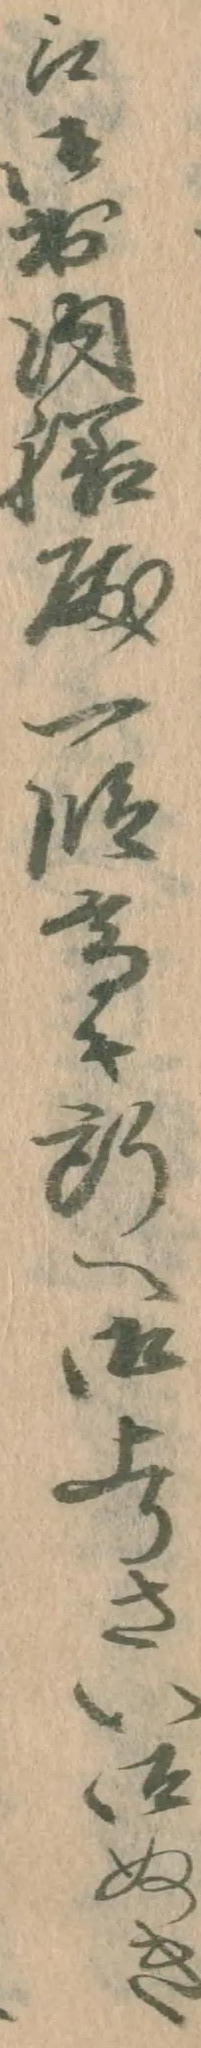江御出内膳殿一段高き所へ御上りさい御ぬき
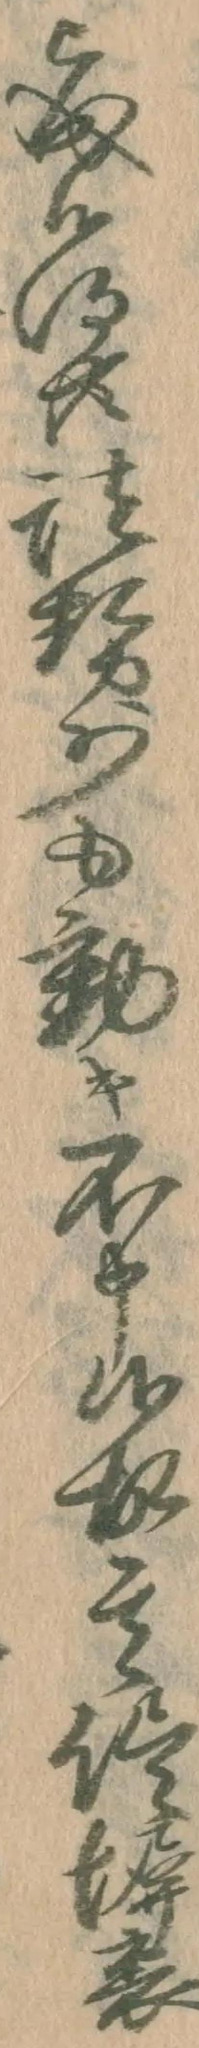被成候得共諸勢少も動き不申候故其侭塀裏
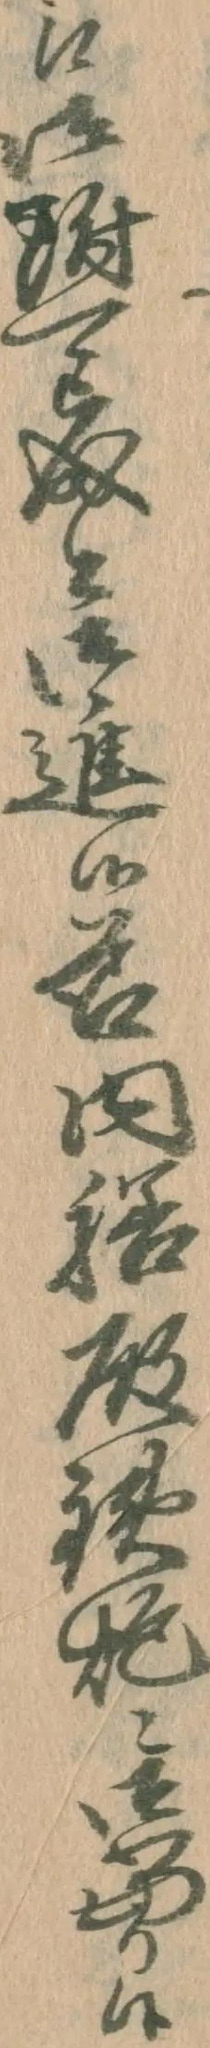江御附可被成と御進候節内膳殿鉄砲に御当り候
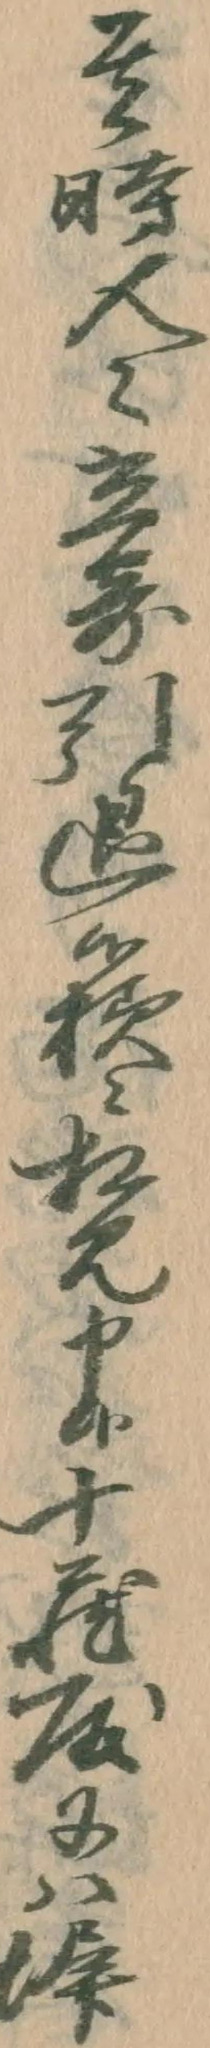其時人々立寄引退候様に相見申候十蔵殿尓は塀
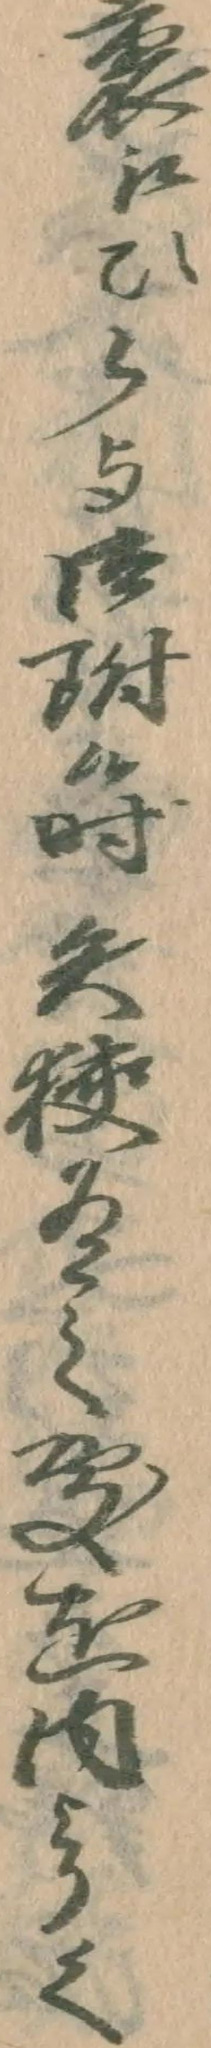裏江ひら与御附候時矢狭有之處を内与りく
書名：切支丹御退治記 49巻. [5]
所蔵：国立国会図書館 National Diet Library, JAPAN
